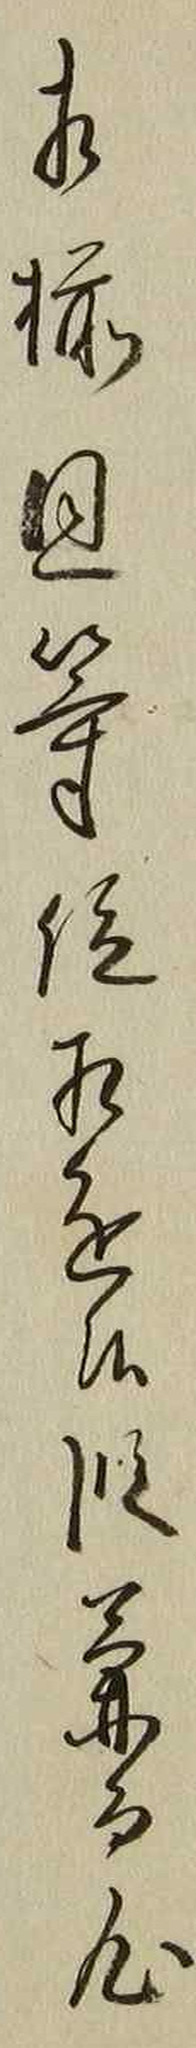相揃且等位相進候段兼而心
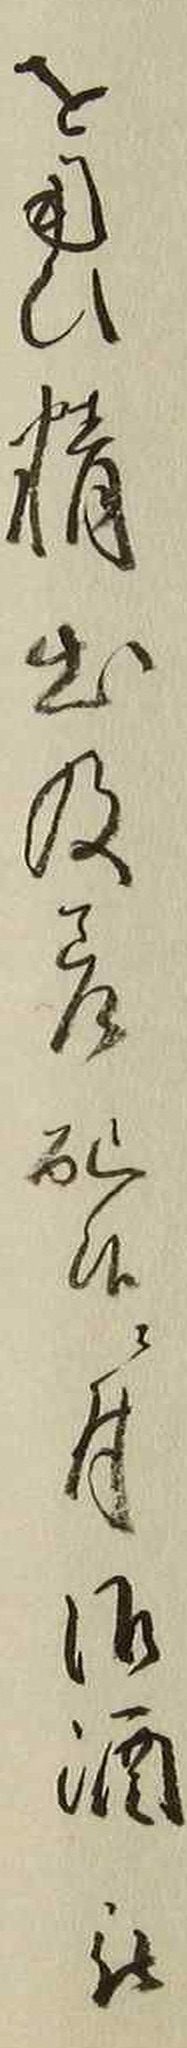を用ひ精出及差配候に付御酒被
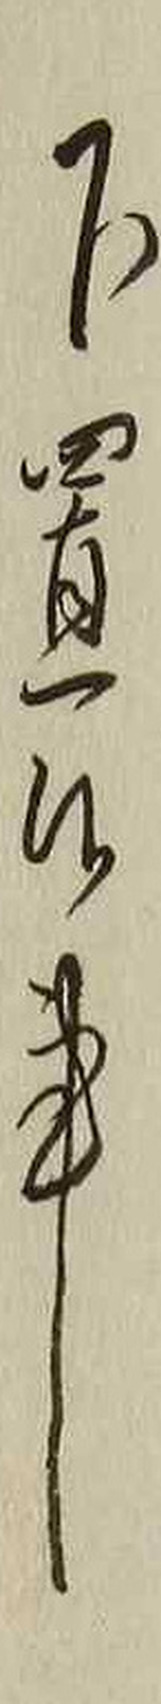下置候事
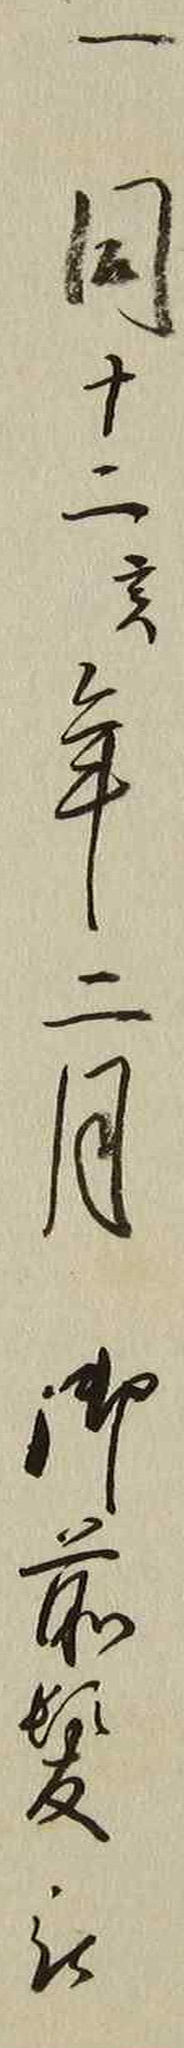一同十二亥年二月御前髪被
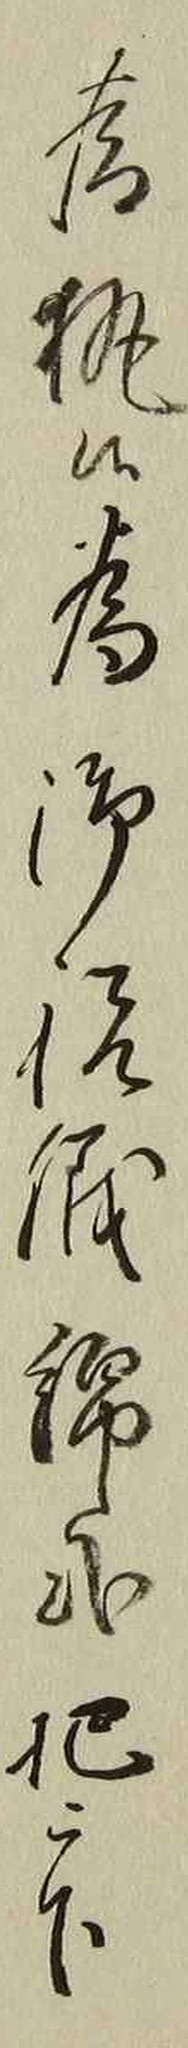為執候為御祝儀綿弐把被下
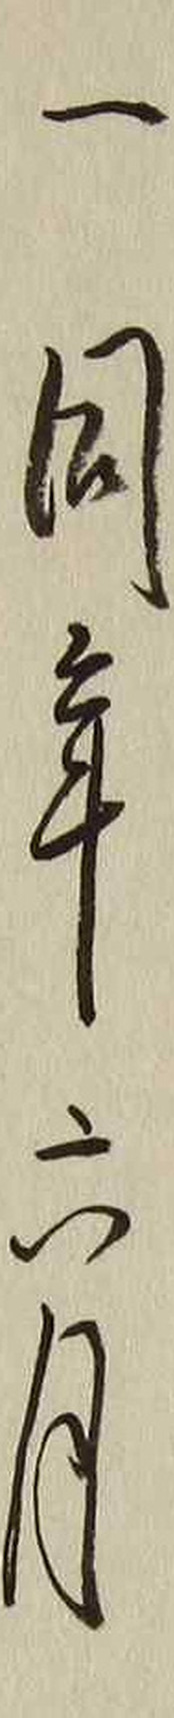一同年六月
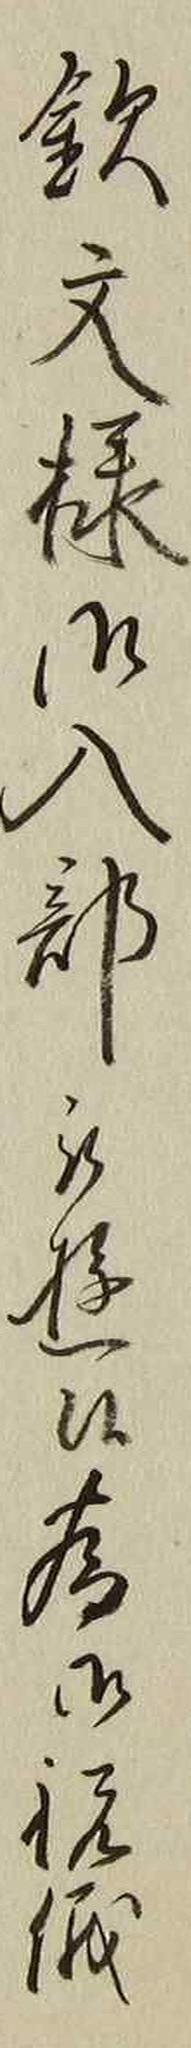欽文様御入部被遊候為御祝儀
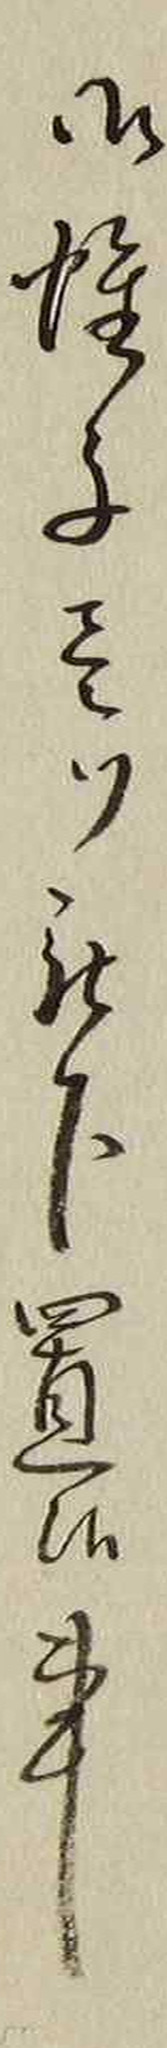御帷子壱ツ被下置候事
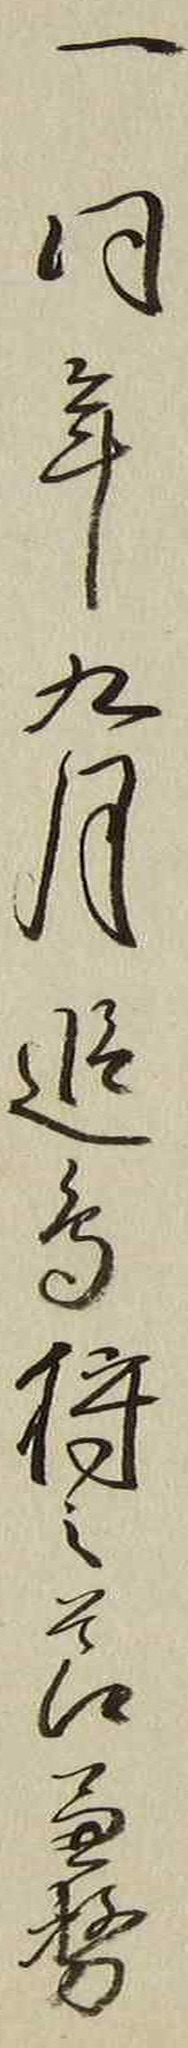一同年九月追鳥狩の節兼務
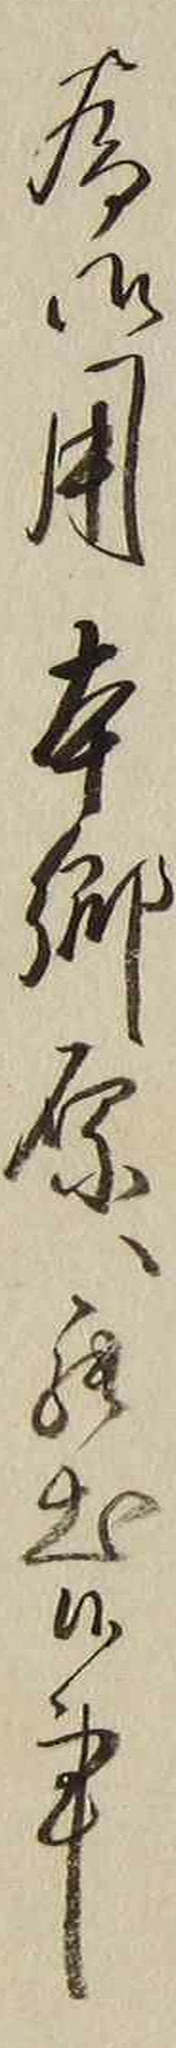為御用本郷原へ罷出候事
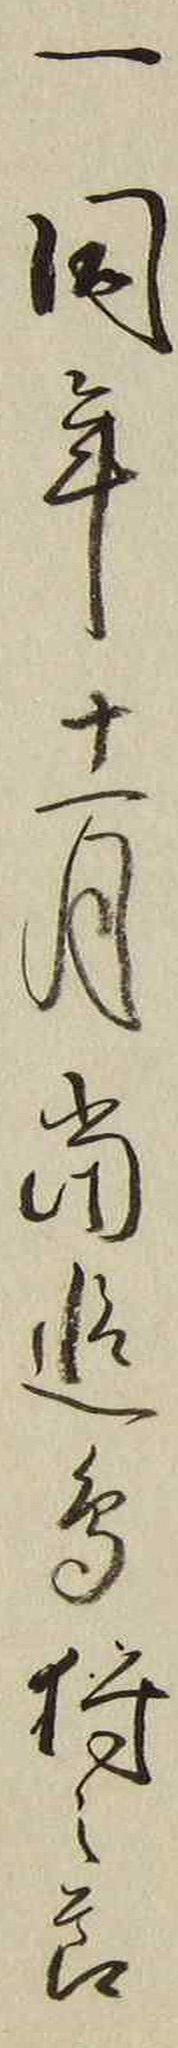一同年十一月当追鳥狩の節

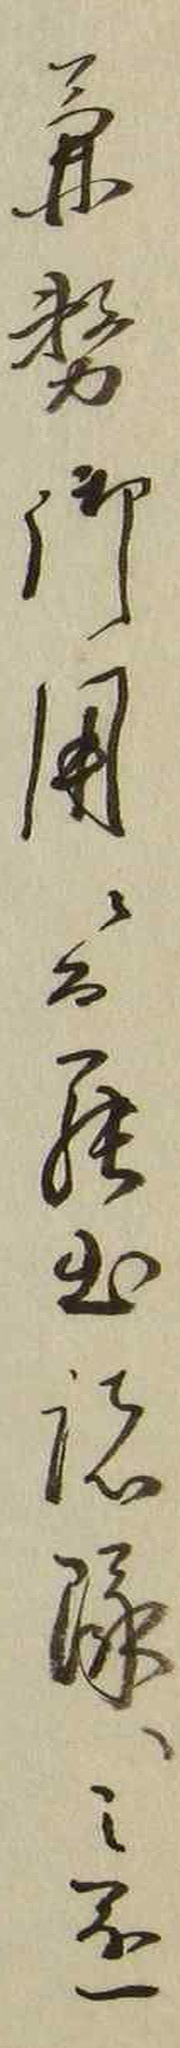兼務御用に而罷出諸隊への懸
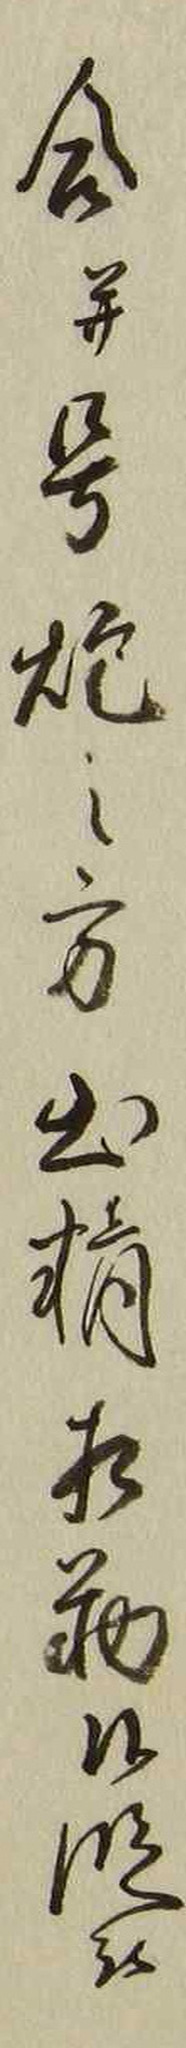合幷号砲の方出精相勤候段被
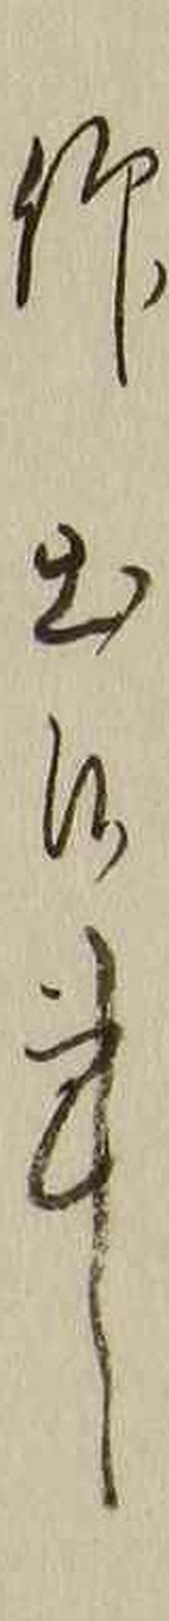仰出候事
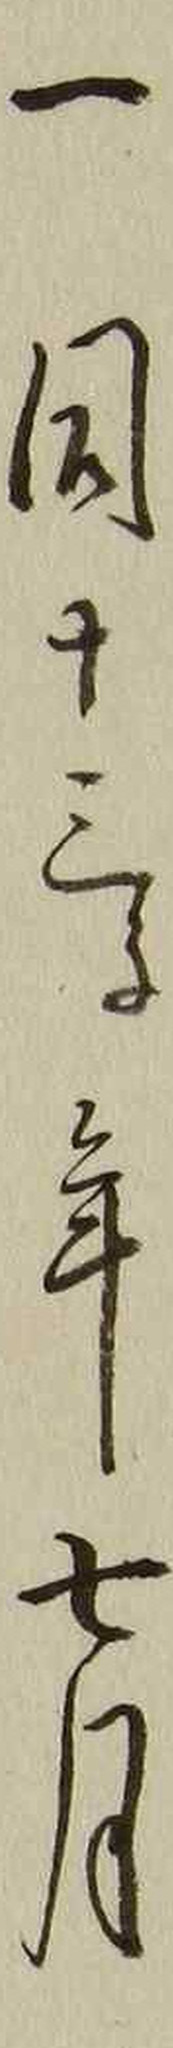一同十三子年七月
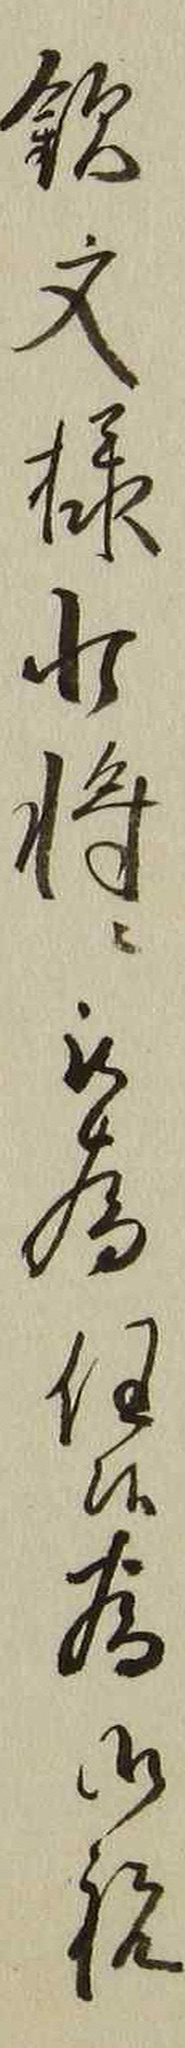欽文様少将に被為任候為御祝
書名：諸士系譜　巻之1　い之部1
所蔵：会津若松市立会津図書館
